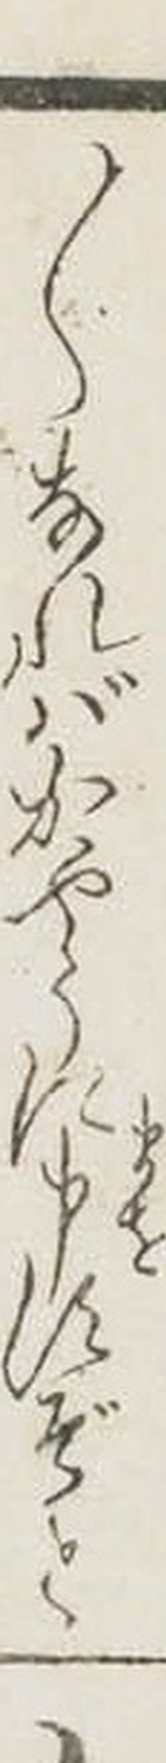〳〵なればかやうに申すぞと
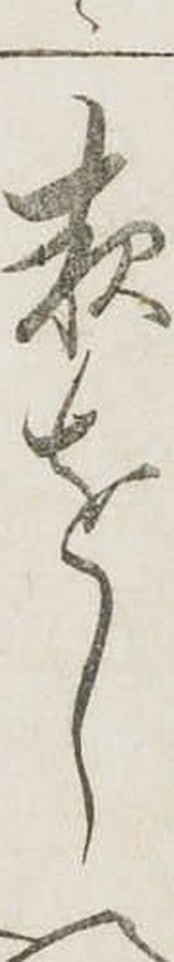夜をし
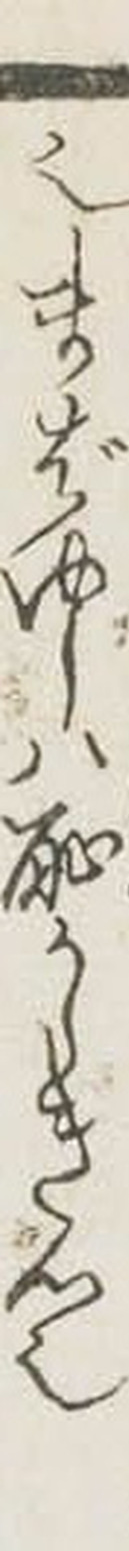也まばゆしは恥かしき心也
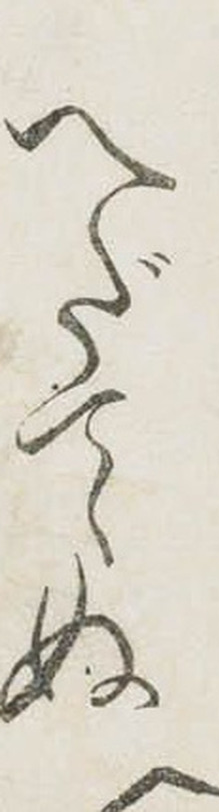へだてぬ
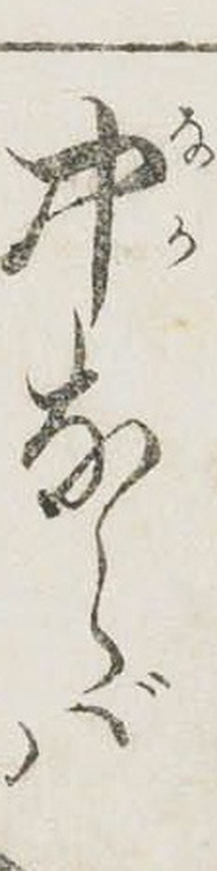中ならば
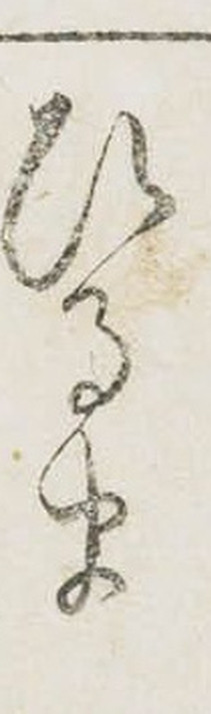ひるま
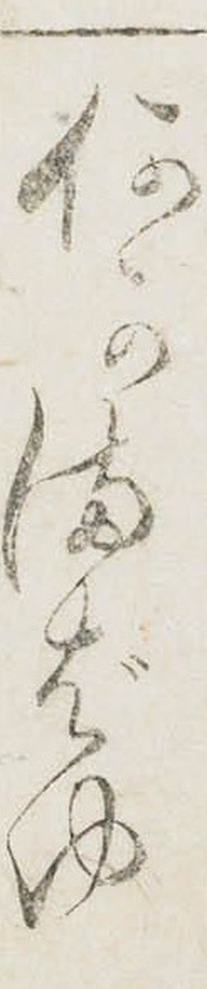何かまばゆ
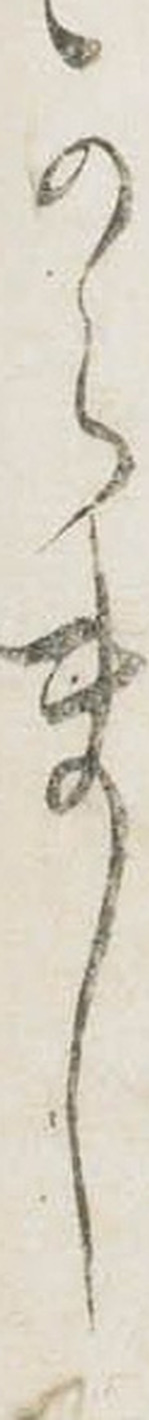からまし
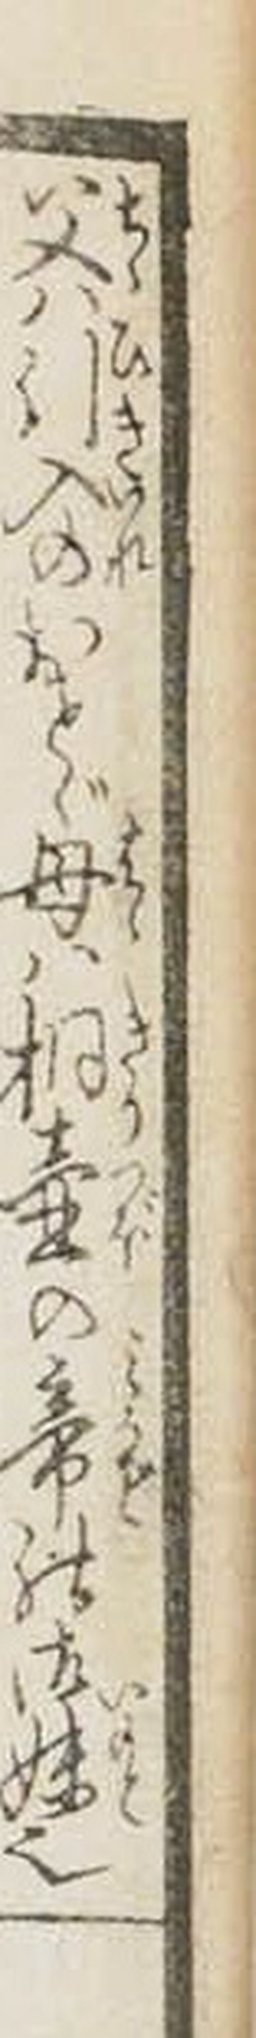父は引入のおとゞ母は桐壺の帝の御妹也
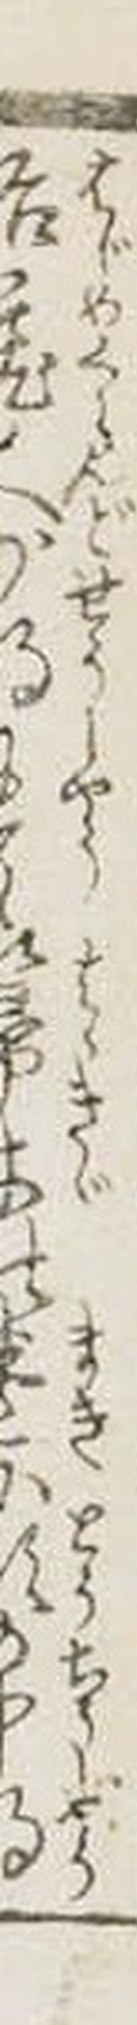始蔵人少将にて帚木の巻に頭の中将
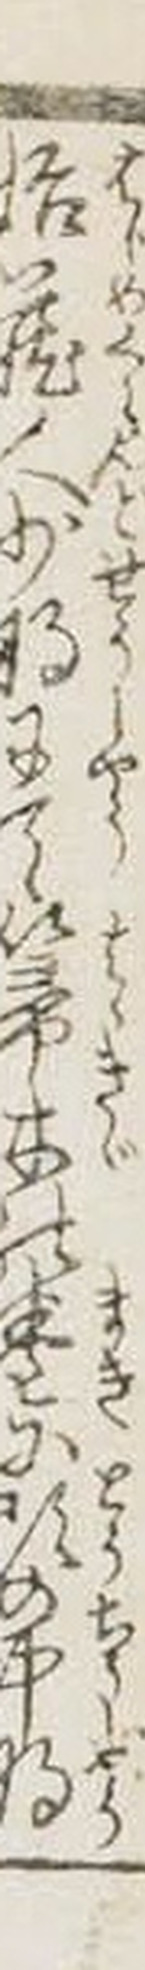始蔵人少将にて帚木の巻に頭の中将
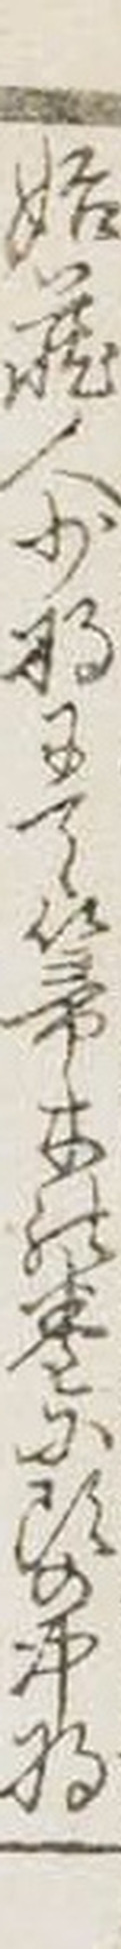始蔵人少将にて帚木の巻に頭の中将
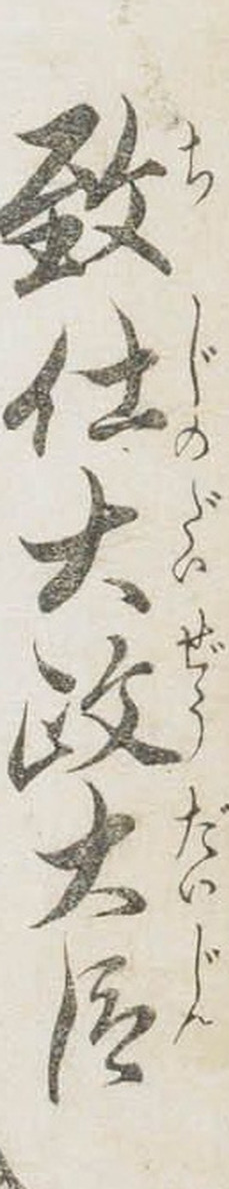致仕大政大臣
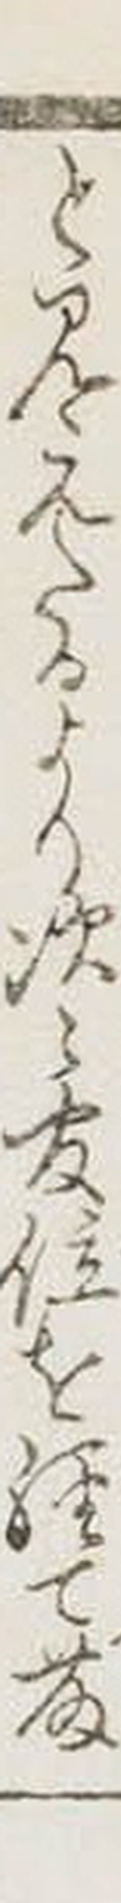と見えたるより次々官位を経て藤
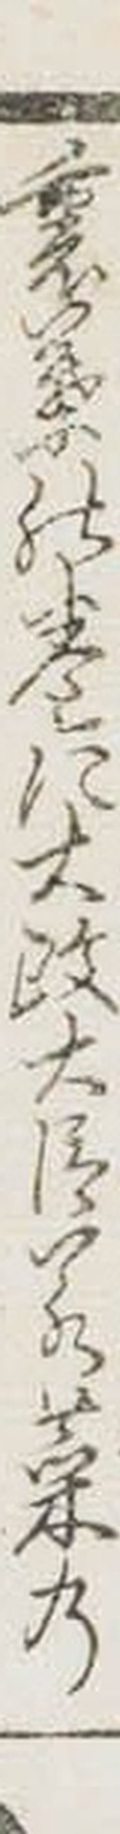裏葉の巻に大政大臣若菜の
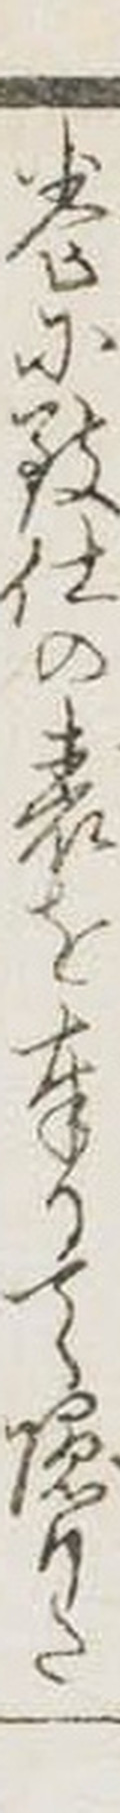巻に致仕の表を奉りて隠りた
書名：源氏百人一首
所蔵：東京学芸大学教育コンテンツアーカイブ
